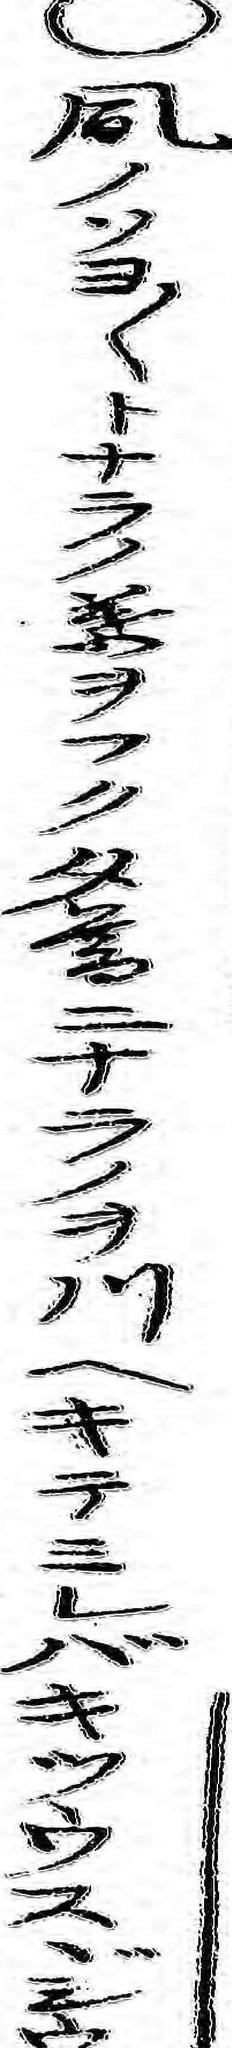◯風ノソヨ〳〵トナラノ葉ヲフク夕暮ニナラノヲ川ヘキテミレバキツウスヾシウ
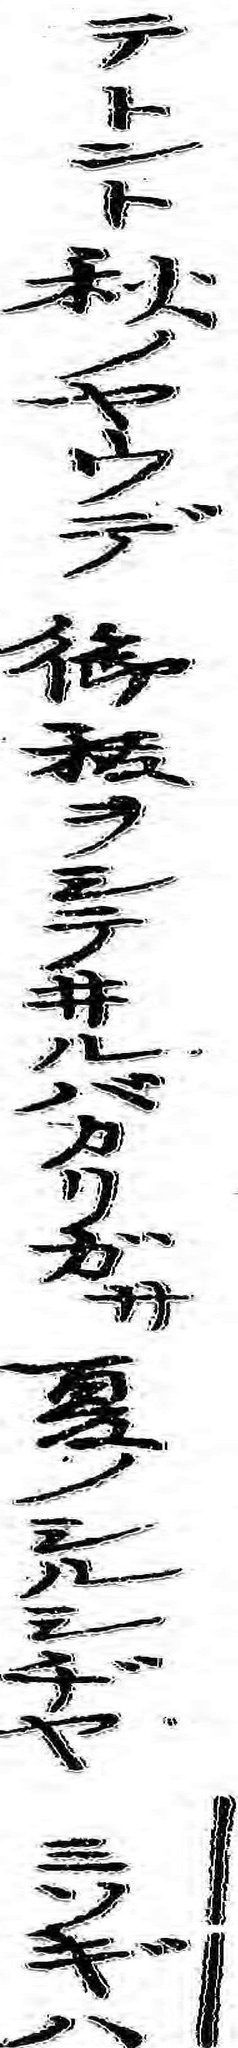テトント秋ノヤウデ御祓ヲシテヰルバカリガサ夏ノシルシヂヤミソギハ
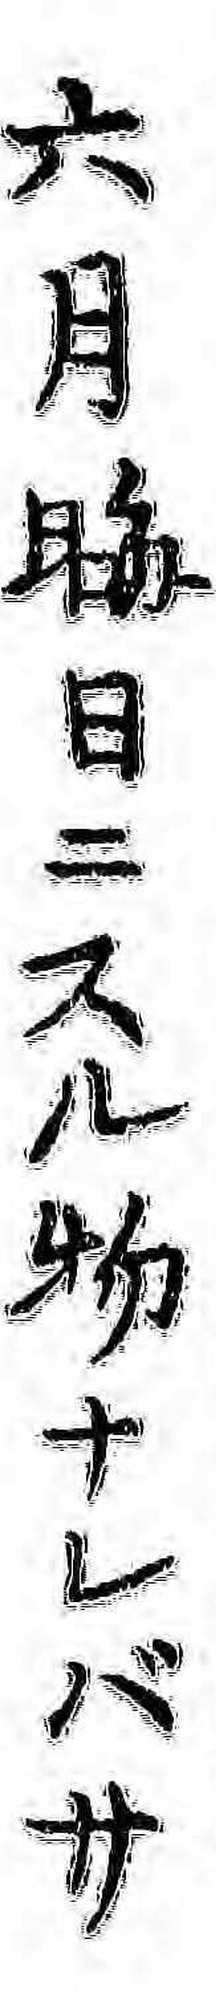六月晦日ニスル物ナレバサ
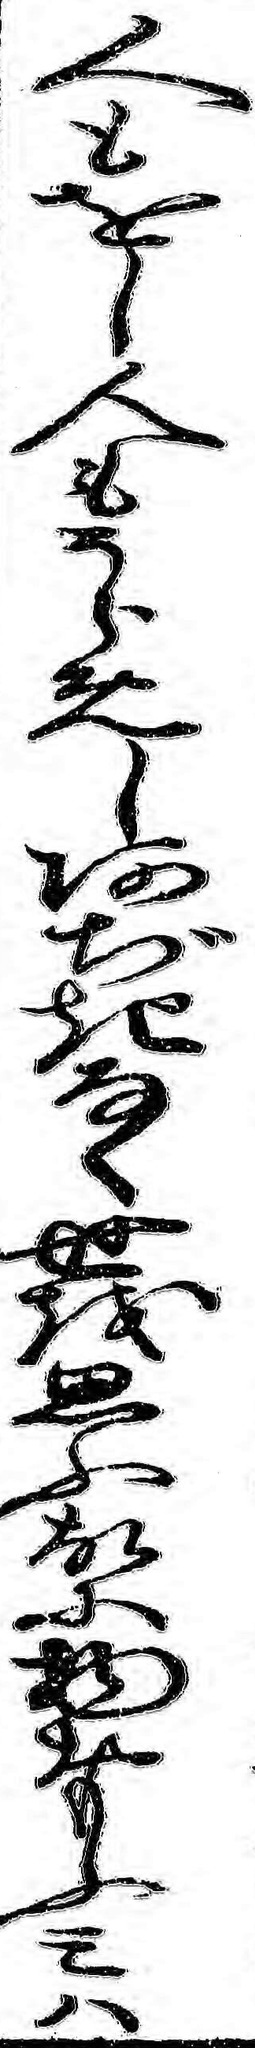人もをし人もうらめしあぢきなく世を思ふ故に物おもふみは
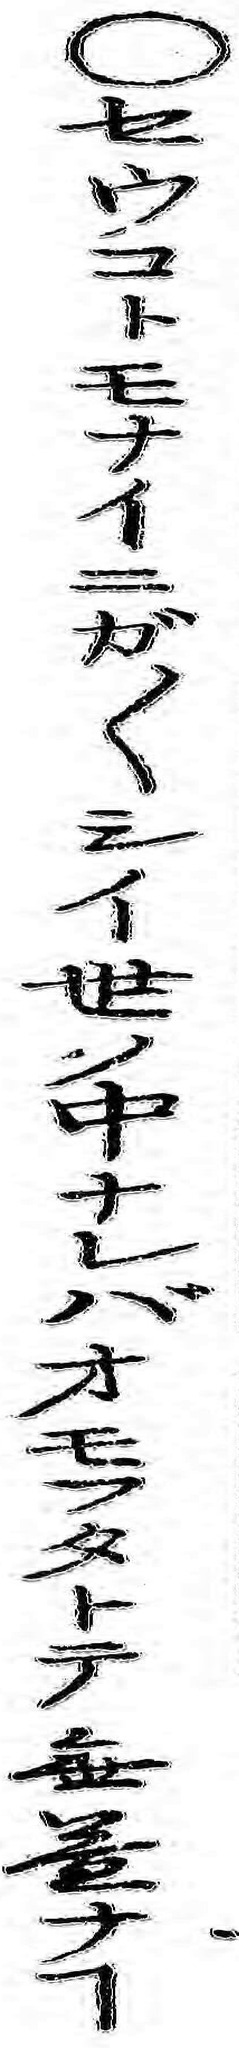◯セウコトモナイニガ〳〵シイ世ノ中ナレバオモフタトテ無益ナコト
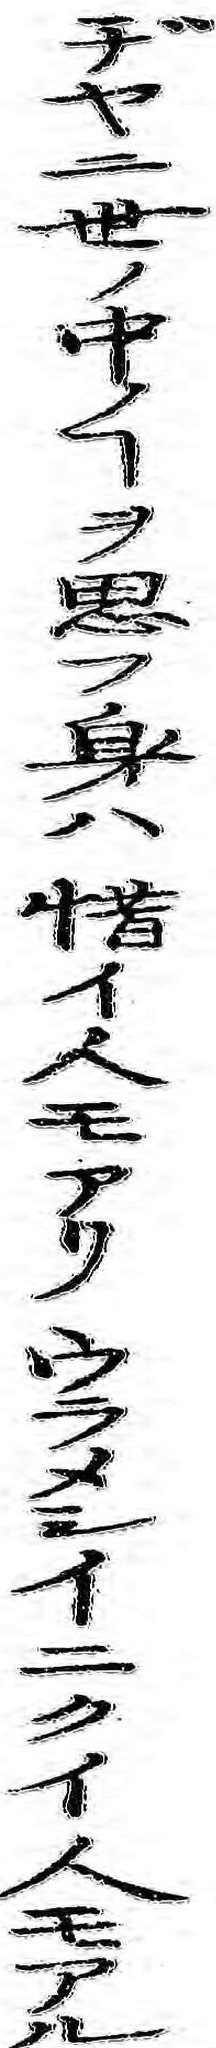ヂヤニ世ノ中ノコトヲ思フ身ハ惜イ人モアリウラメシイニクイ人モアル
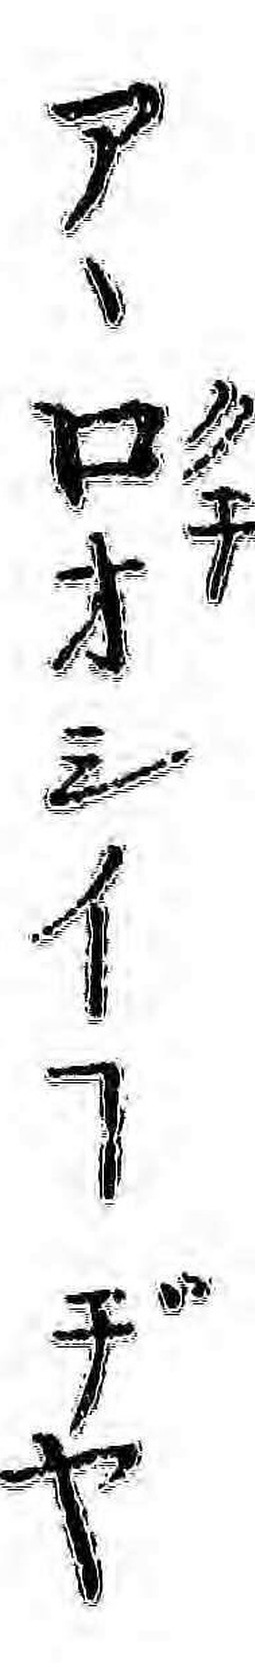アヽ口オシイコトヂヤ
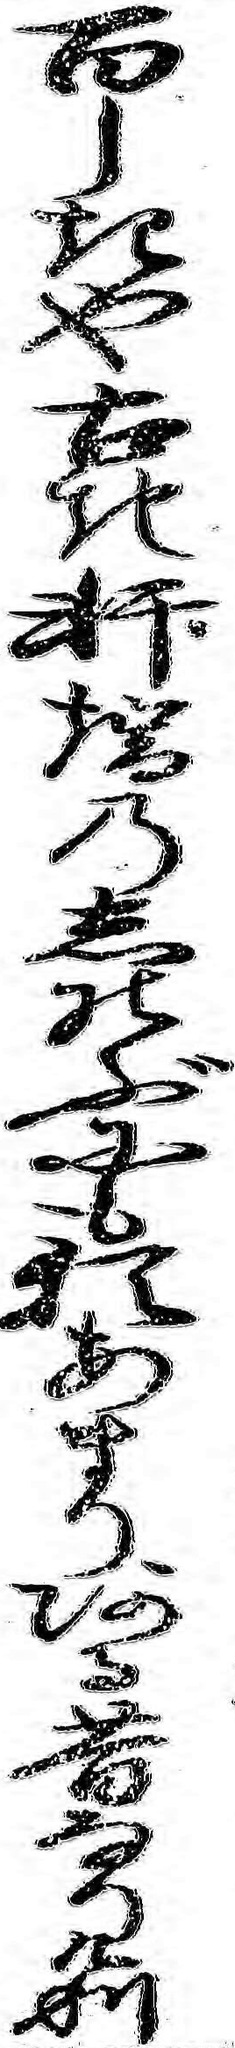百しきや古き軒端のしのぶにも猶あまりある昔なりけり
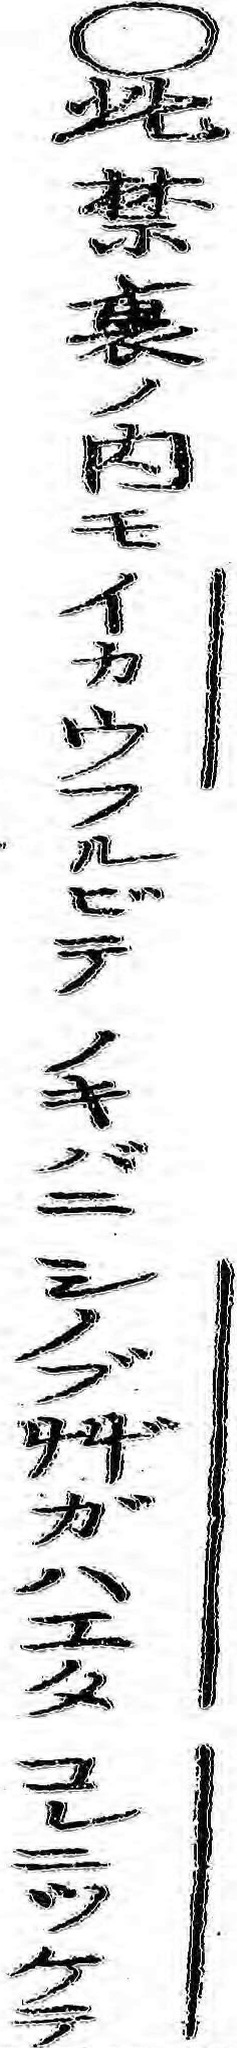◯此禁裏ノ内モイカウフルビテノキバニシノブ艸ガハエタコレニツケテ
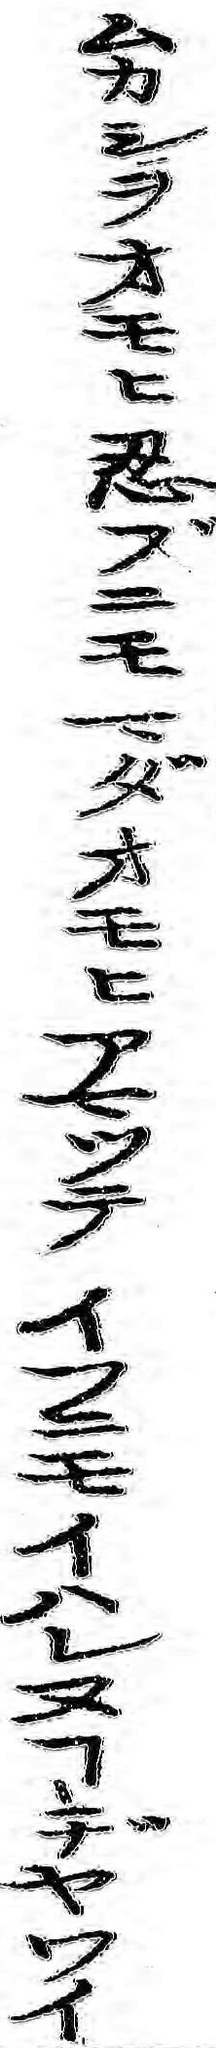ムカシヲオモヒ忍ブニモマダオモヒアマツテイフニモイハレヌコトヂヤワイ

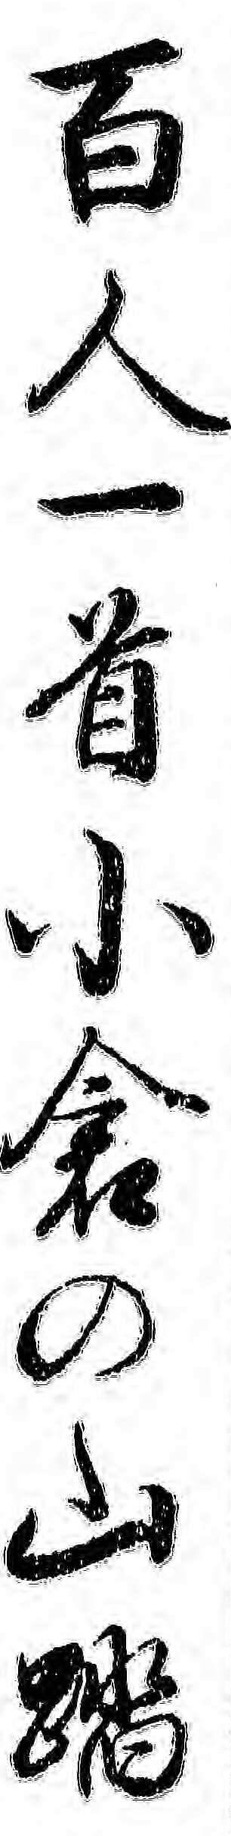百人一首小倉の山踏
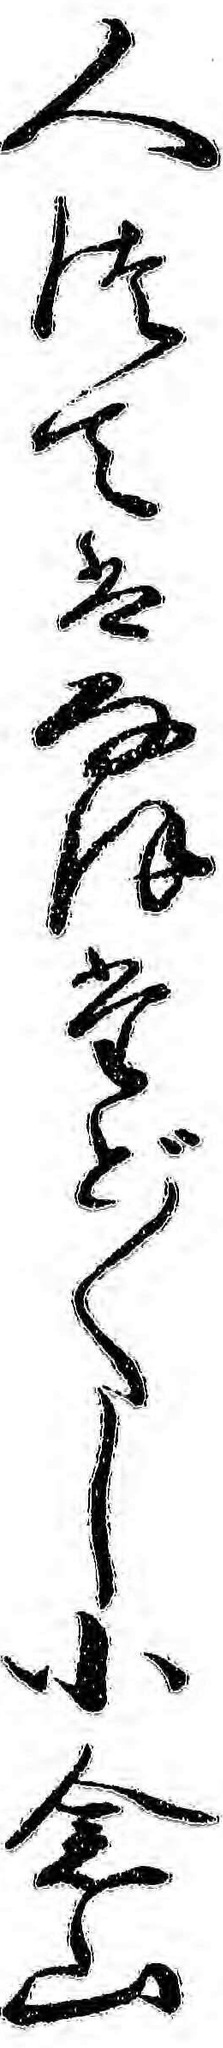人つてはなほたど〳〵し小倉山
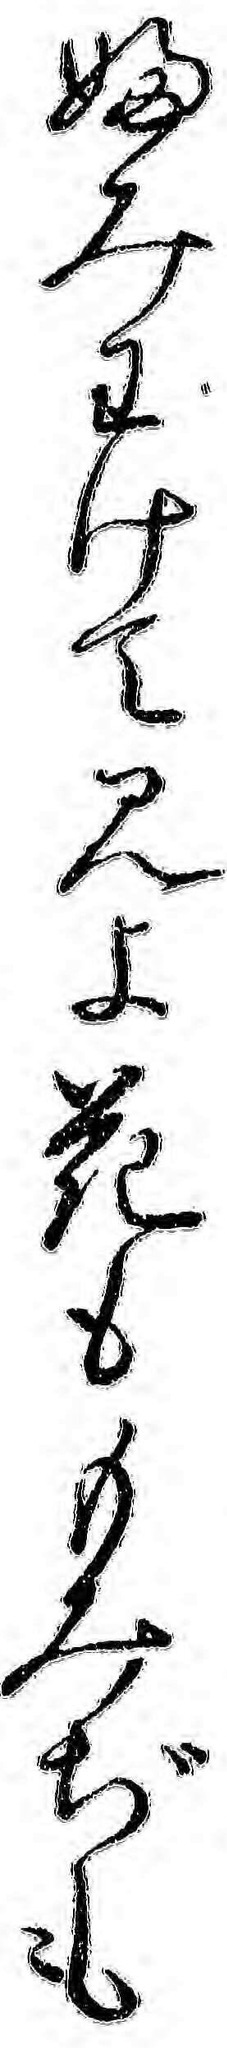ふみわけて見よ花ももみぢも
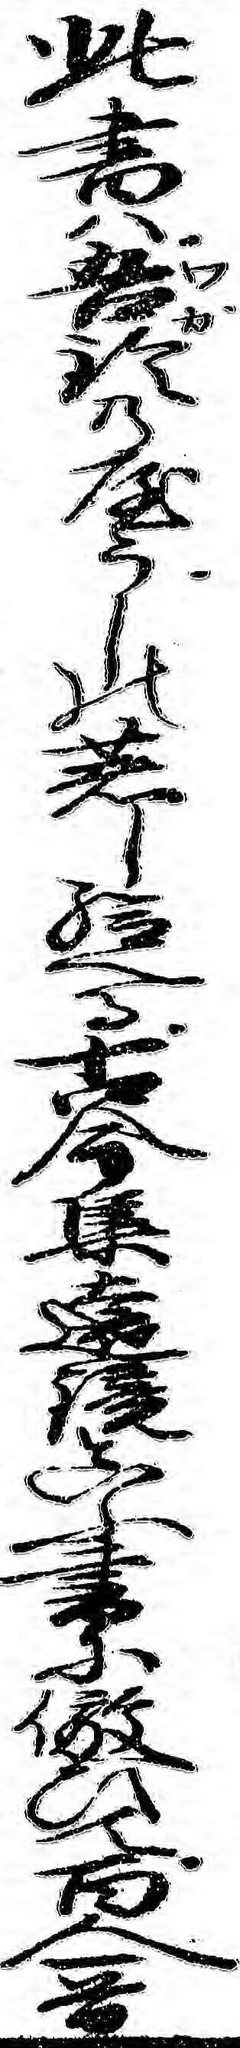此書は。吾鈴の屋うしの著し給へる。古今集遠鏡といふ書に倣ひて。百人一首
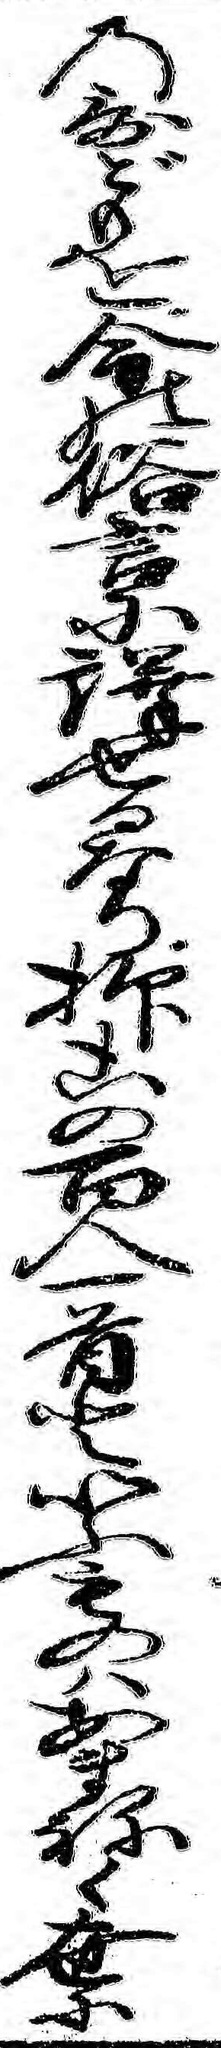の哥どもを。今の俗言に訳せるなり。抑古の百人一首といふものはあまねく世に。
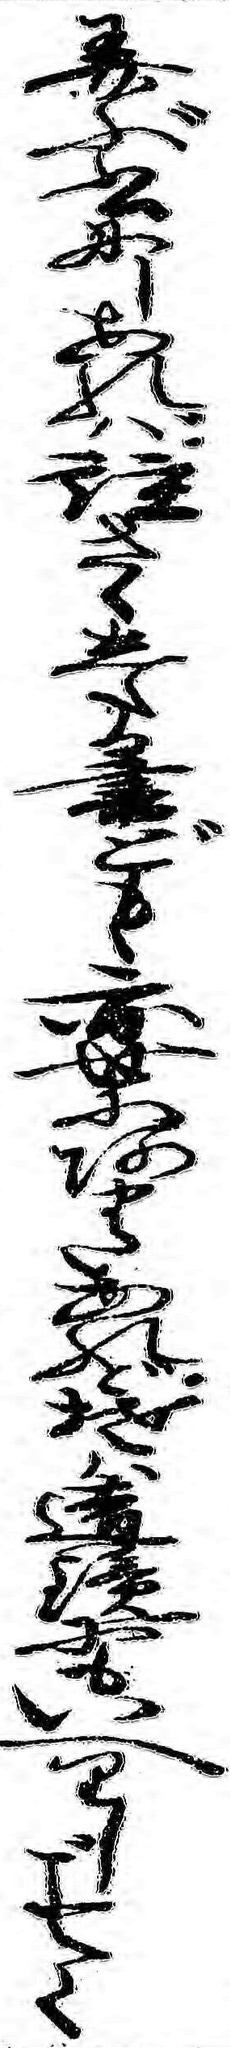弄ぶ書にしあれば。註さくしたる書どもゝ亦世にあまたあれど。そは遠鏡にもいへりしごとく
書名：百人一首／小倉の山ふみ
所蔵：国文学研究資料館
